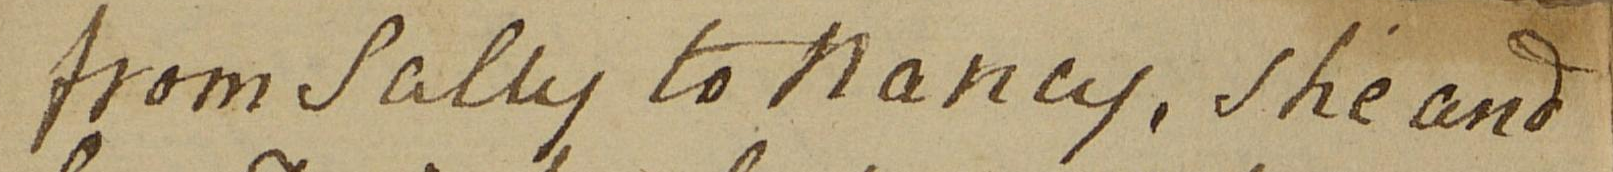from Sally to Nancy, she and
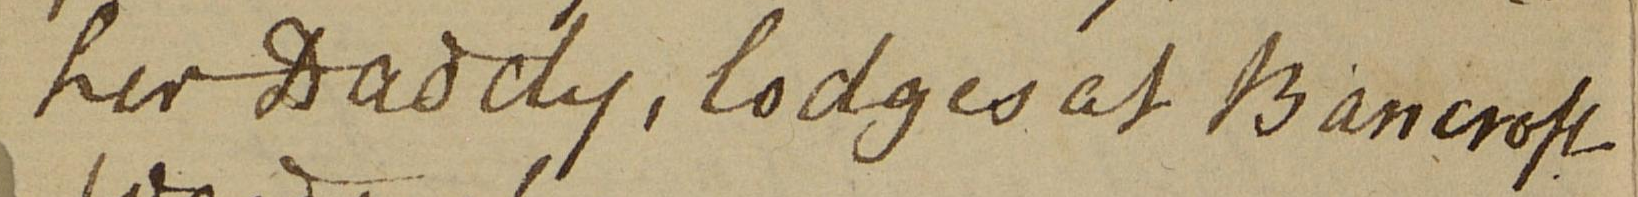her Daddy, lodges at Bancroft
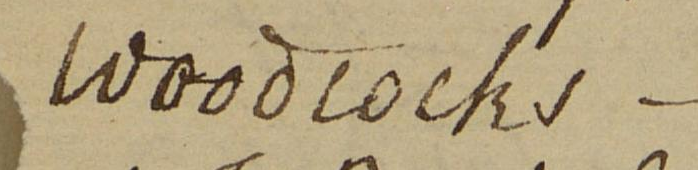Woodcocks-
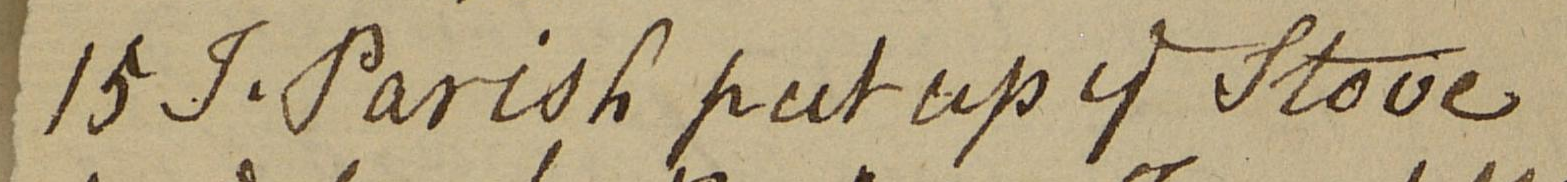15 J. Parish put up y^e Stove
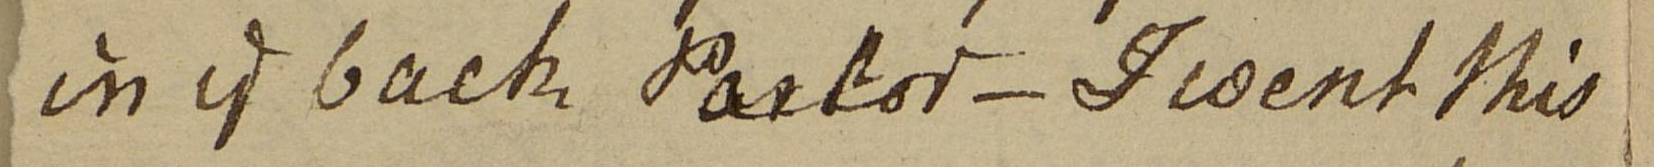in y^e back Parlor- I went this
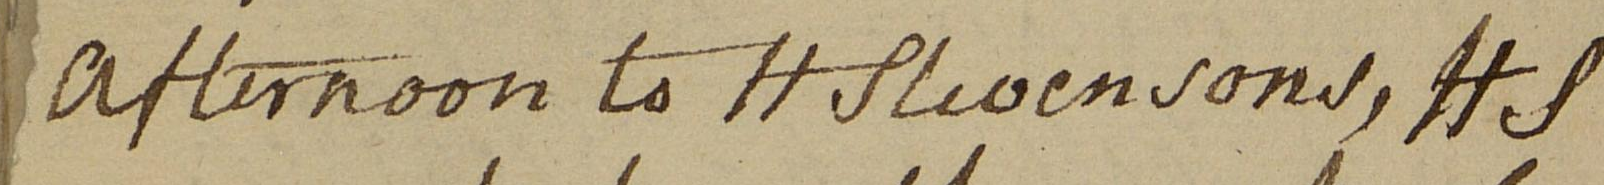Afternoon to H Stevensons, HS
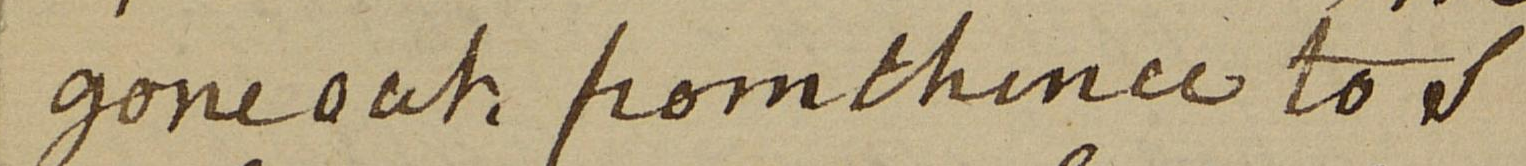gone out from thence to S
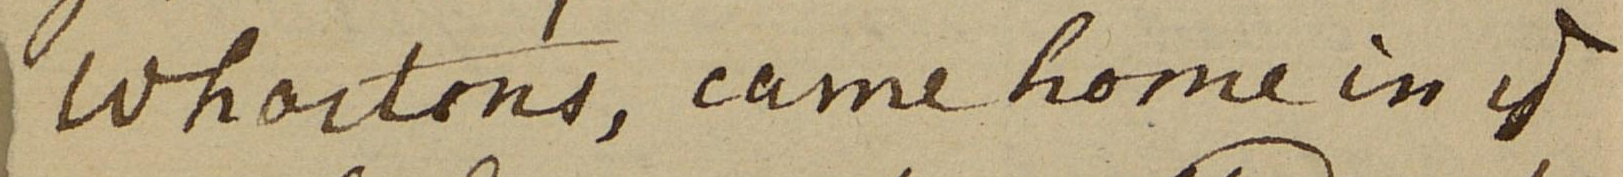Whartons, came home in y^e
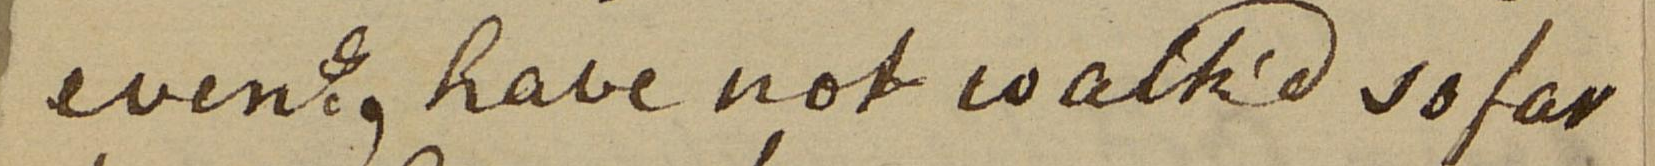even^g, have not walk'd so far
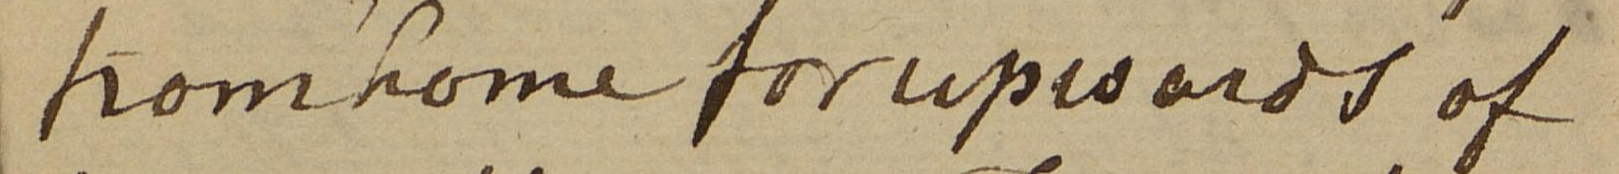from home for upwards of
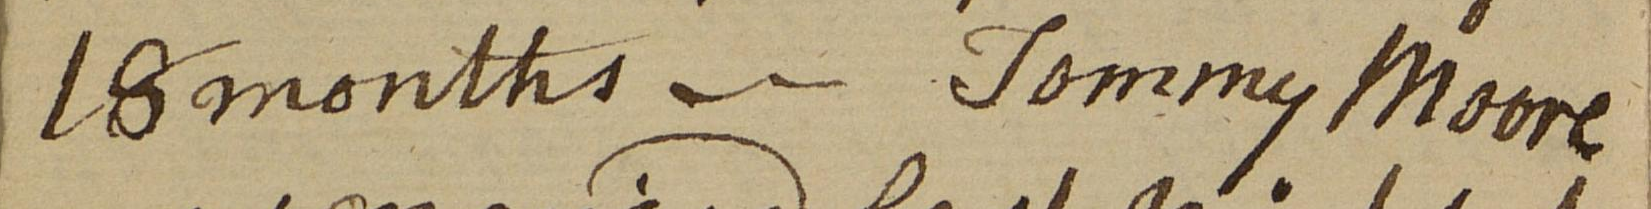18 months-- Tommy Moore
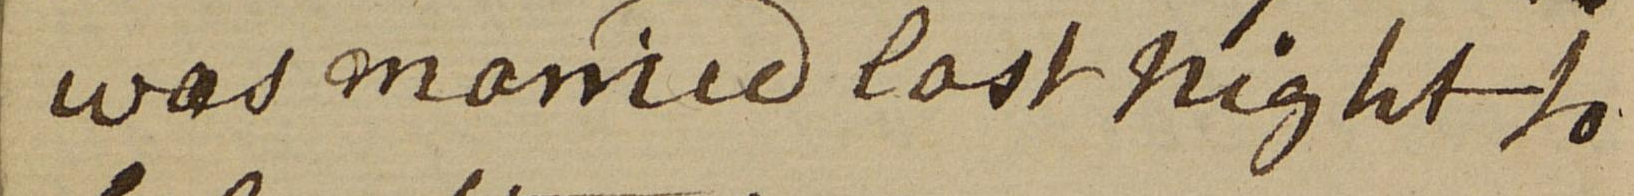was married last night to
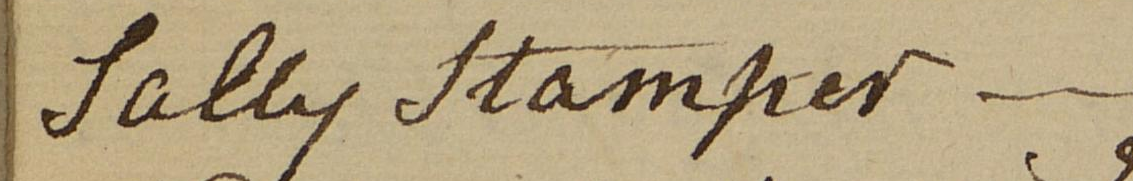Sally Stamper-
